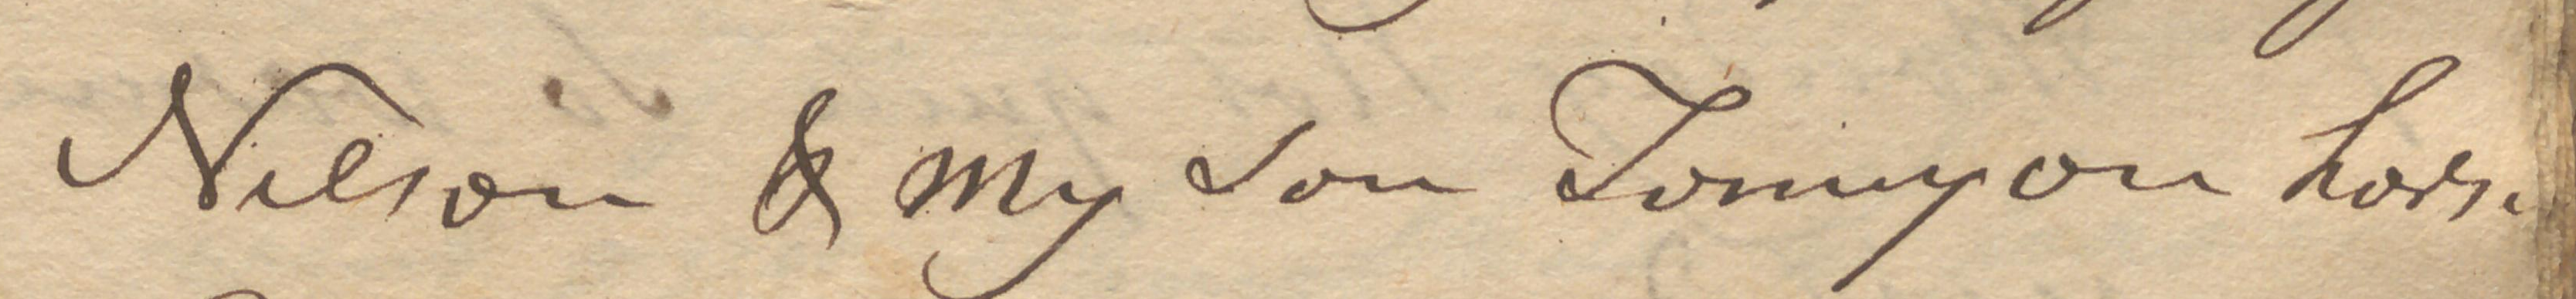Nelson & my son Tomey on horse
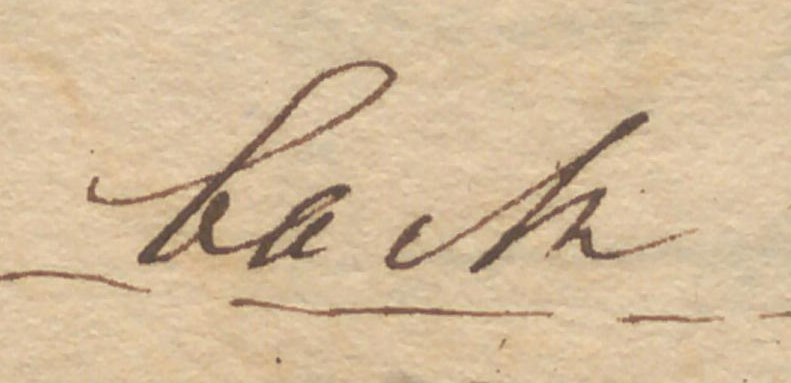back
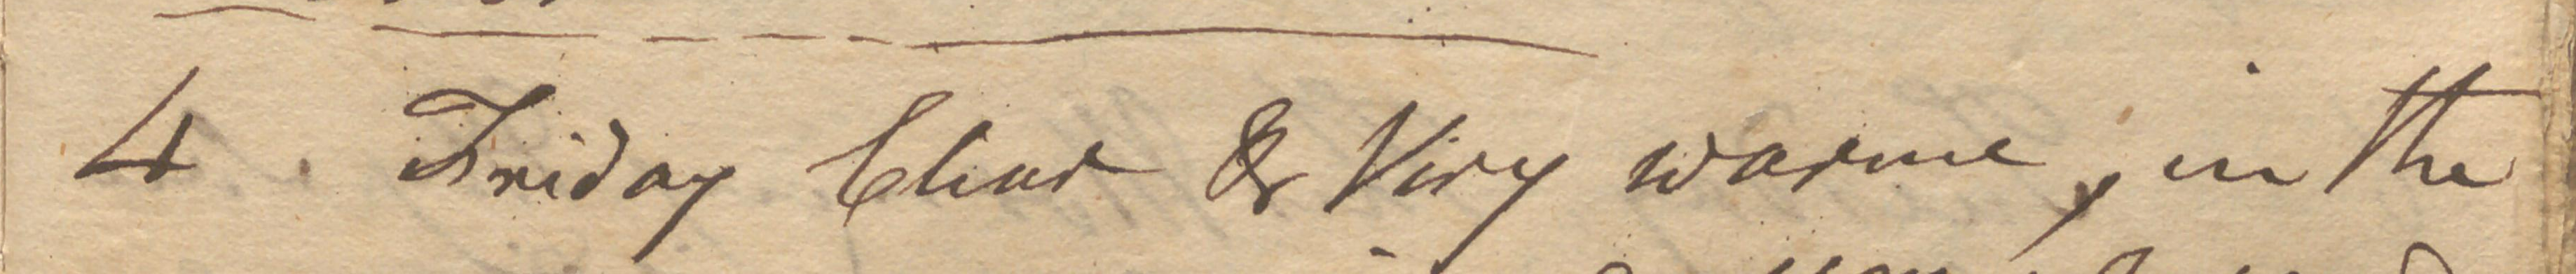4. Friday Clear & Very warme, in the
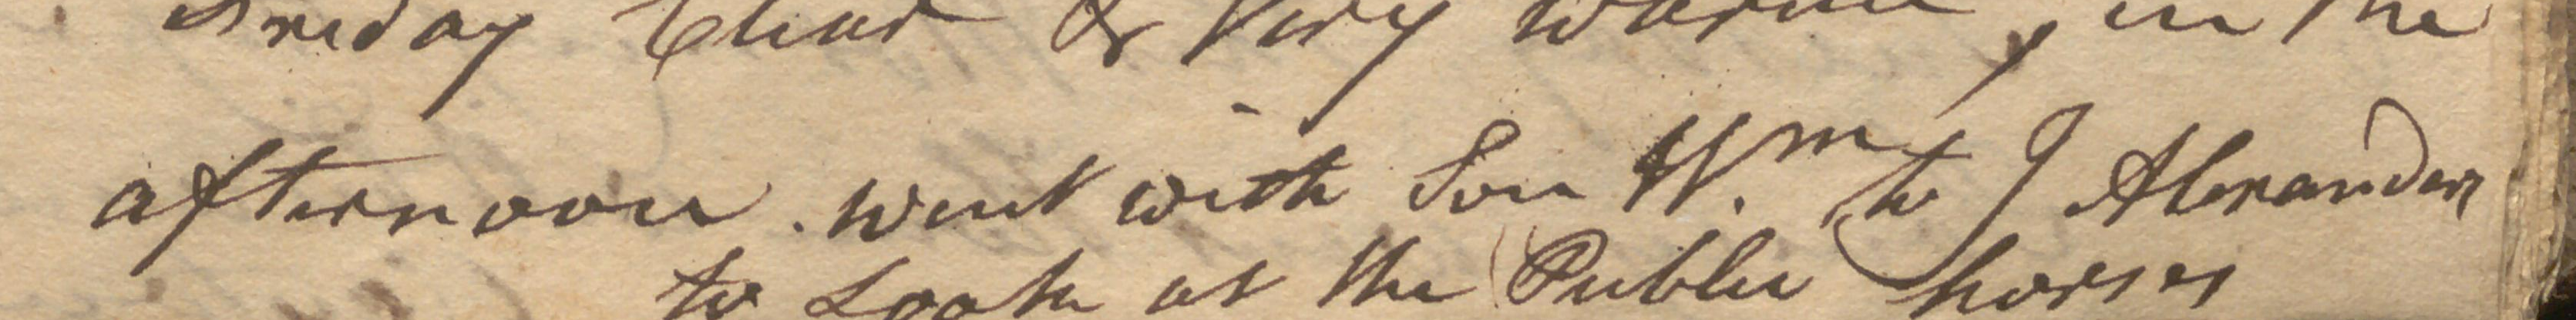afternoon. went with Son W^m. to J Alenanders
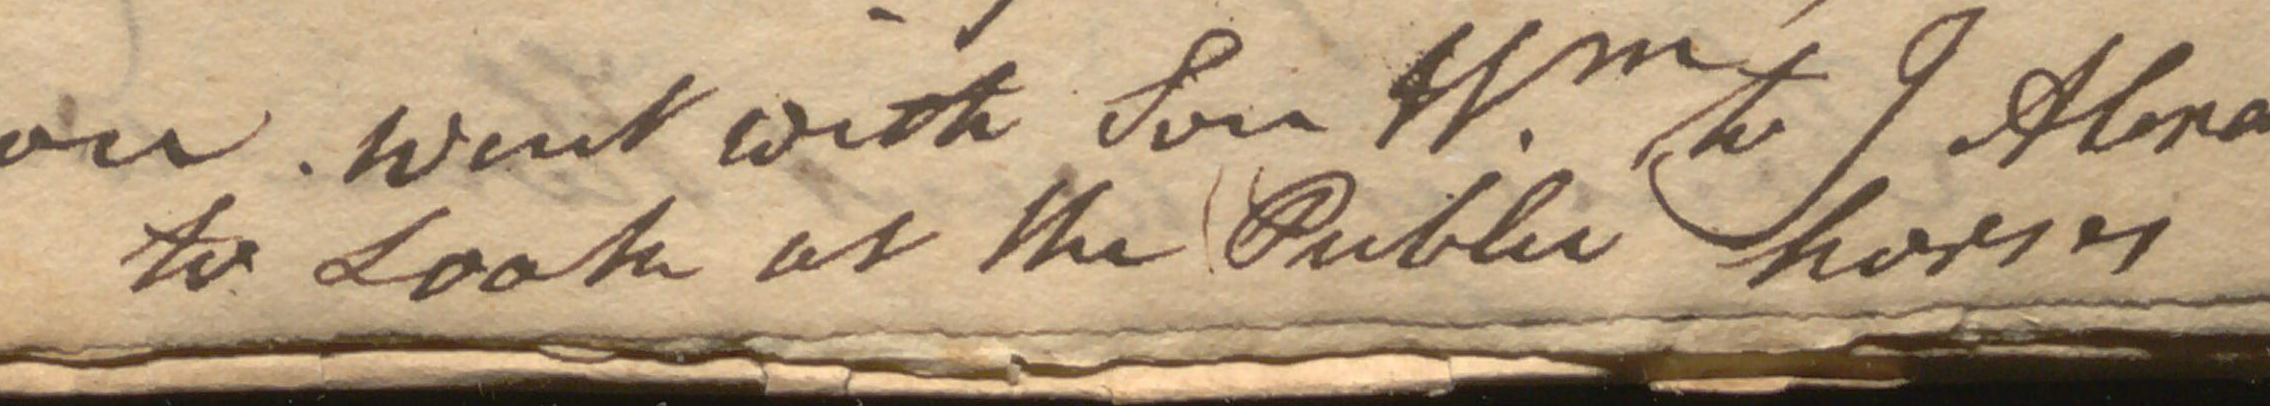to Loak at the Public horses
